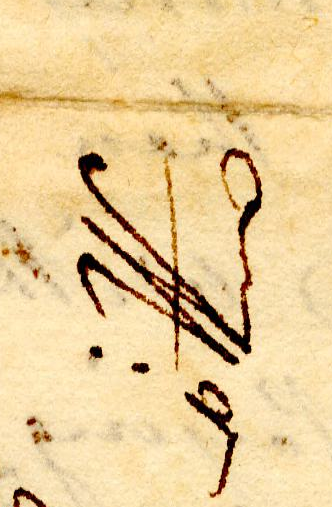M^r:
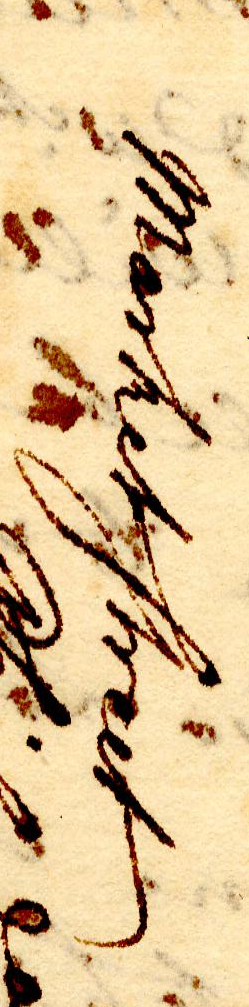Market Street
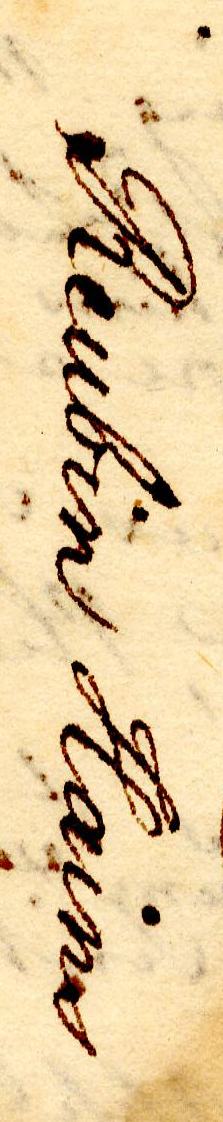Reubin Hains
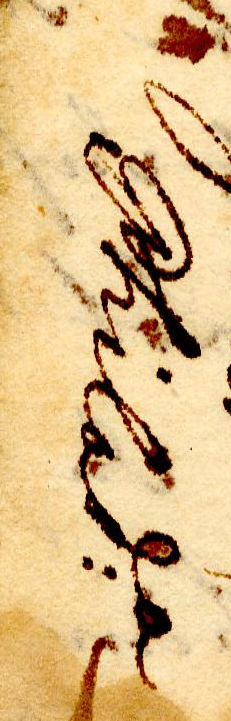Philad:^a
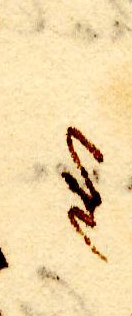in
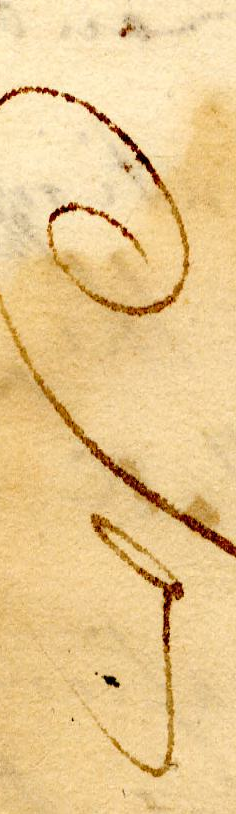To
